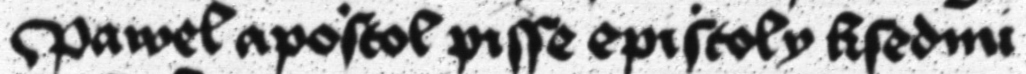Pawel apoẛtol píſſe epiẛtoly k ſedmi
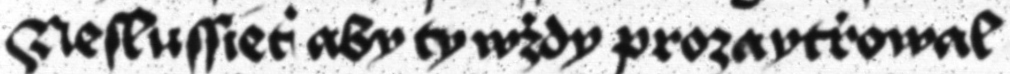Nesluſſíeť aby ty wżdy prozaytṙowal
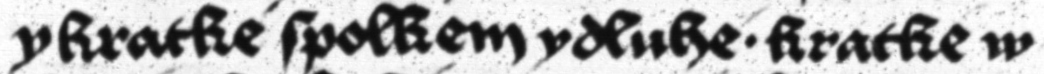y kratké ſpolkem y dluhé. kratke w
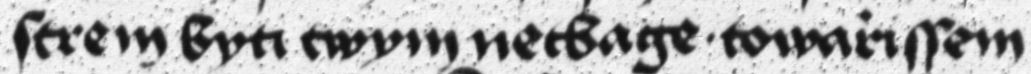ſtrem byti twym netbage. towaṙiſſem
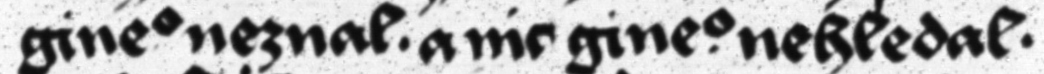gine° neznal. a nic gine° nehledal.
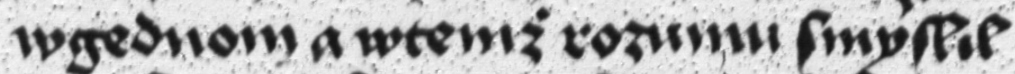wgednom a wtemż rozimu ſmyſlil
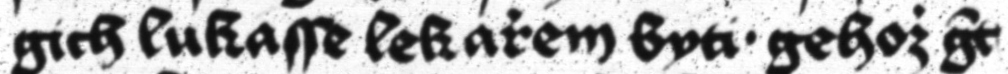gich lukaſſe lekaṙem byti. gehoż ḡt
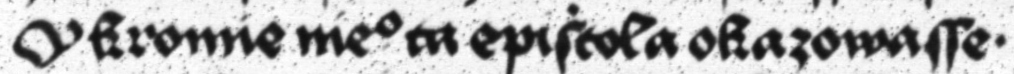Y kromie nie° ta epiẛtola okazowaſſe.
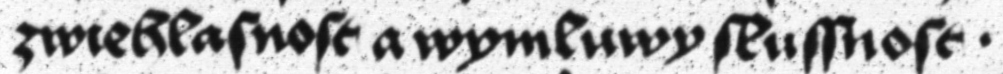zwiehlaſnoſt a wymluwy ſluſſnoſt.
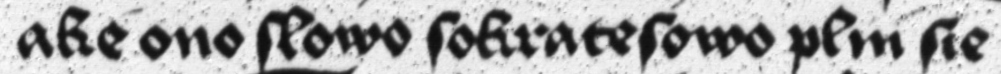aké ono ſlowo ſokrateſowo plní ſie
